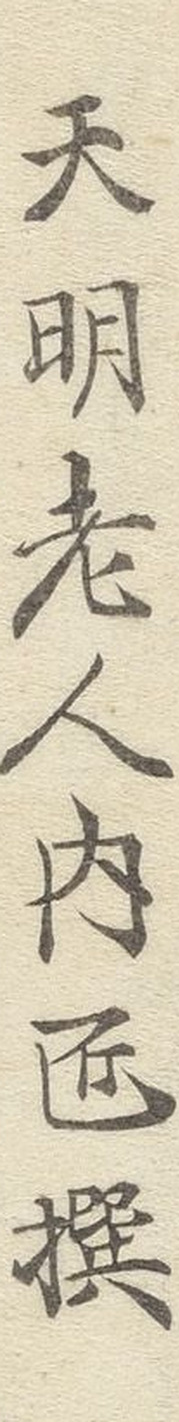天明老人内匠撰
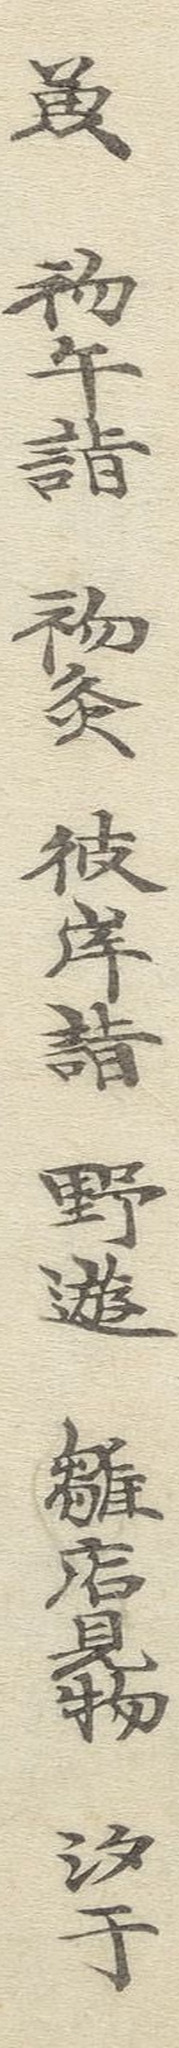兼初午詣初灸彼岸詣野遊雛店見物汐干
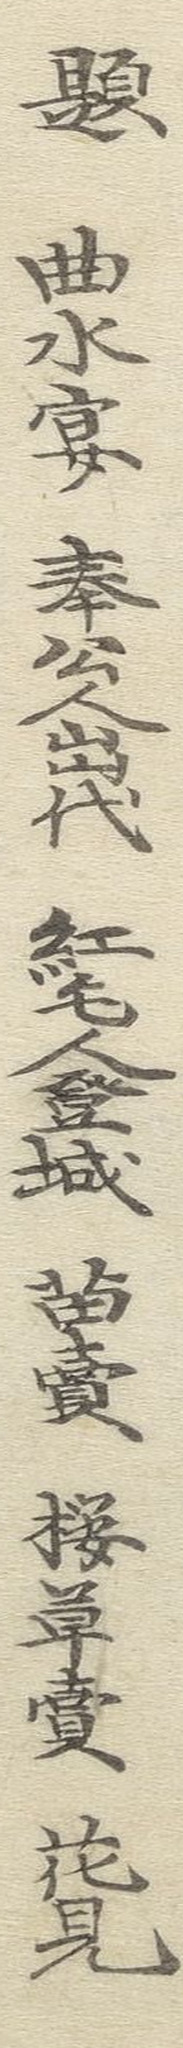題曲水宴奉公人出代紅毛人登城苗売桜草売花見
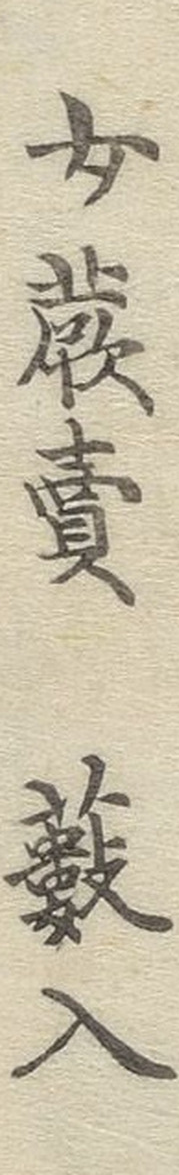女蕨売藪入

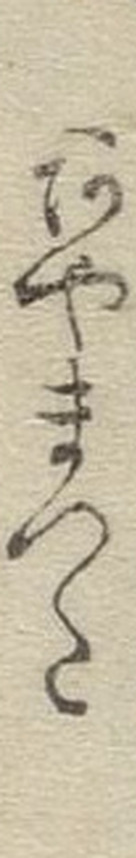あやまつた
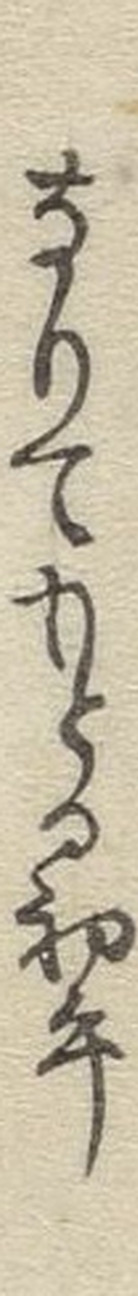なりてもとる初午
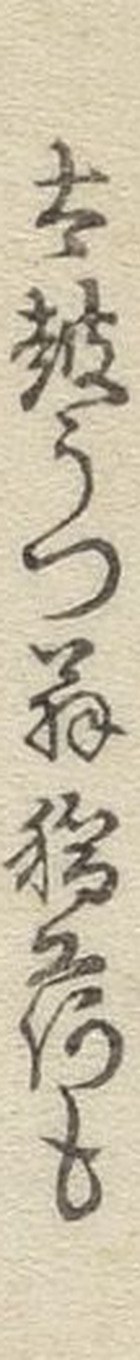太鼓うつ翁稲荷も
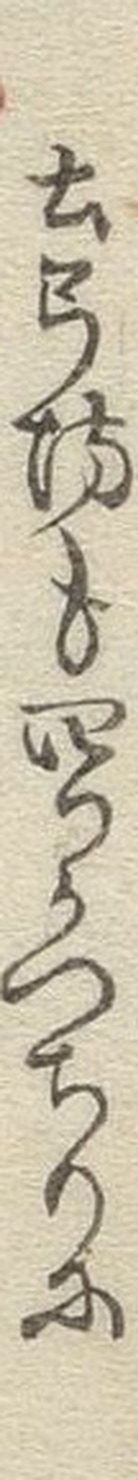土巳坊も四つかつちりに
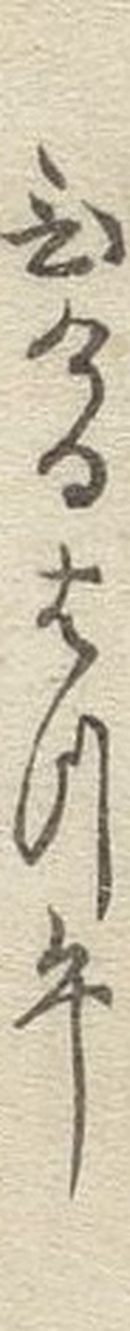ひけるはつ午
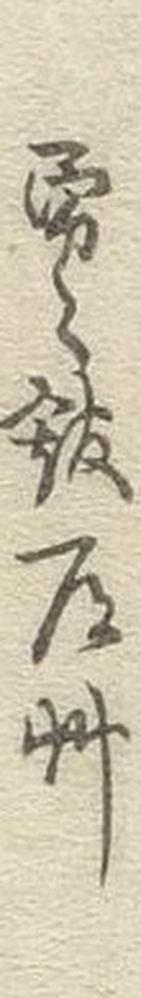勇々館道草
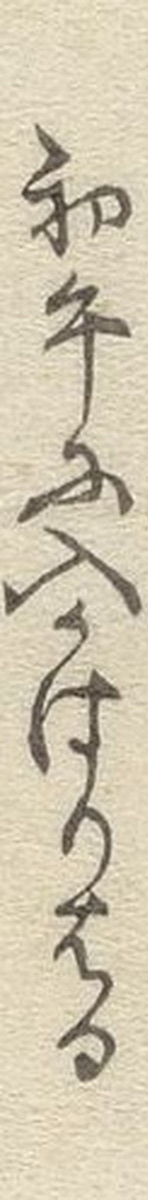初午に入かはりはる
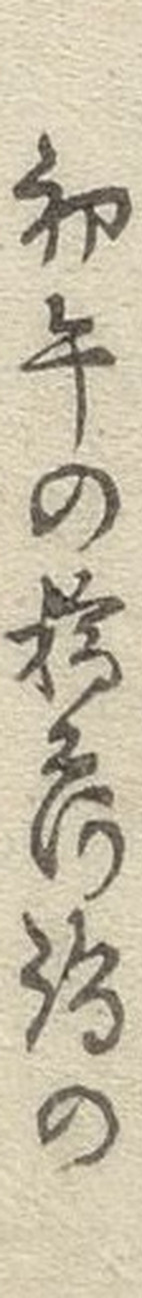初午の稲荷詣の
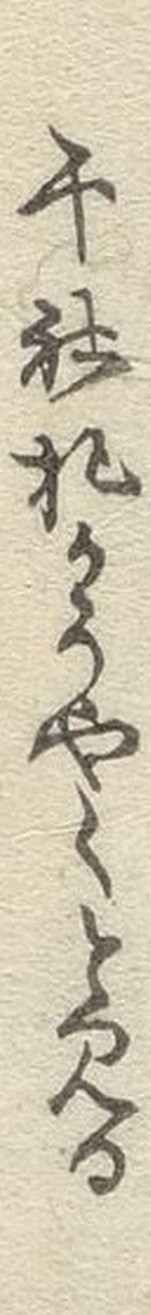午社札かうやくと見る
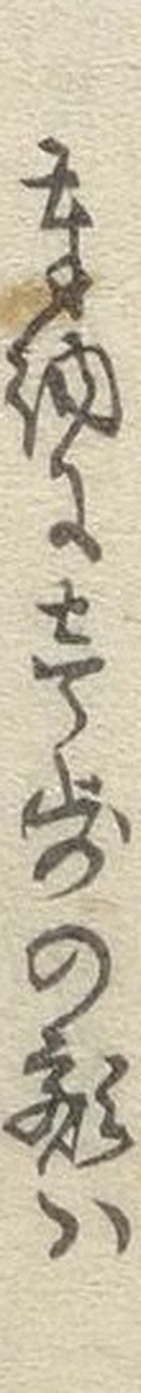奉納に壱歩の額は
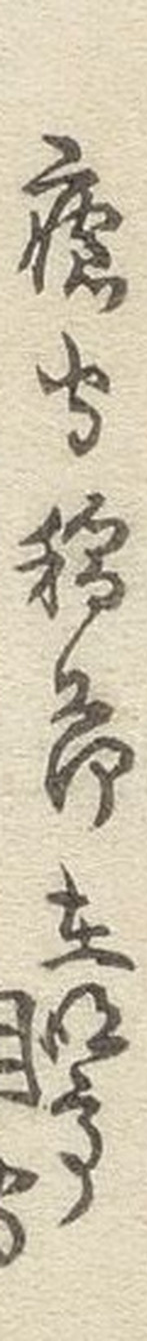瘡守稲荷在明亭
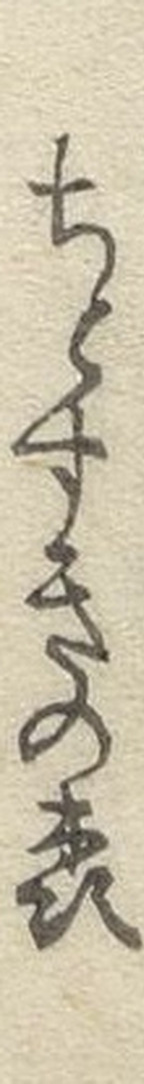ちとすきの森
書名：Picture Album of People with Kyōka (Light Verse) (Kyōka shiki jinbutsu 狂歌四季人物)
